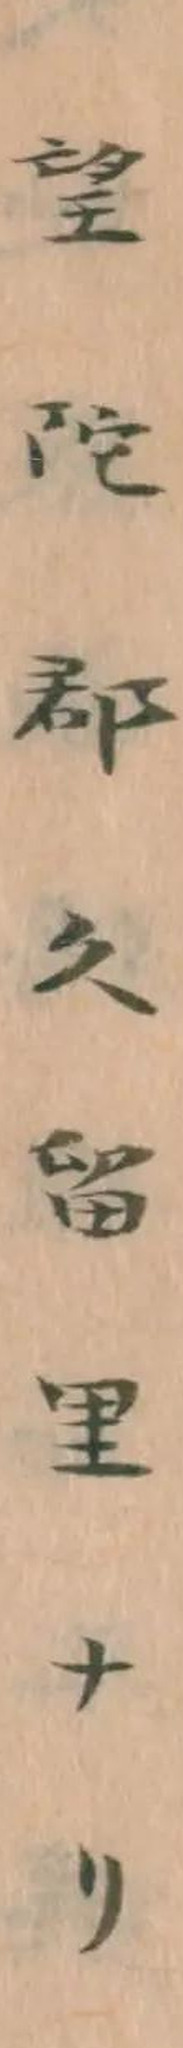望阿郡久留里ナリ
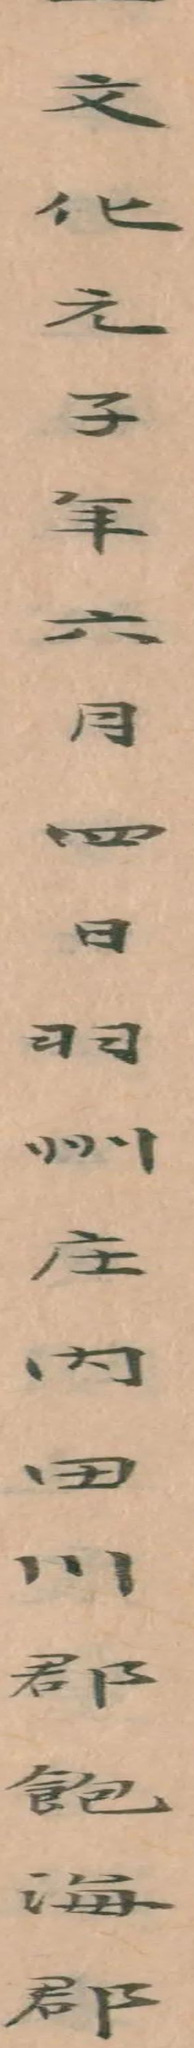一文化元子年六月四日羽州庄内田川郡飽海郡
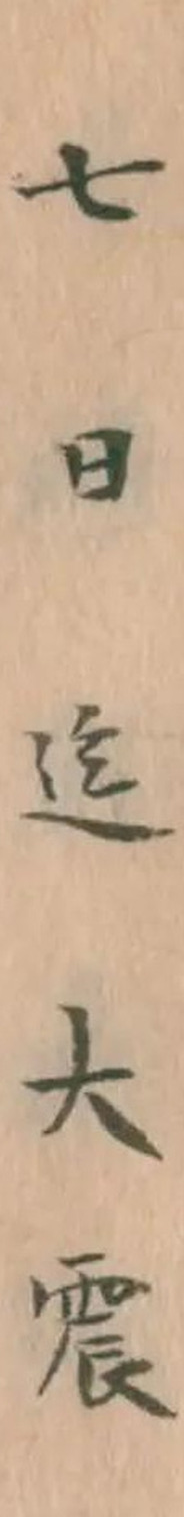七日迄大震
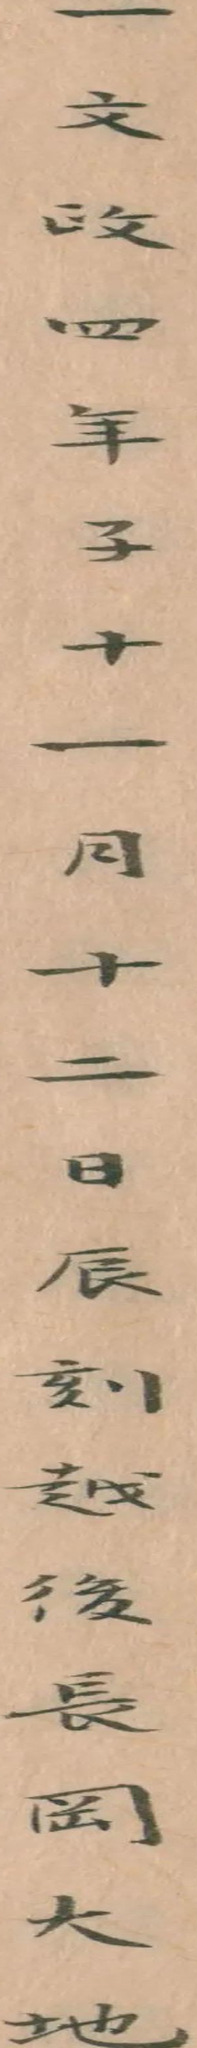一文政四年子十一月十二日辰刻越後長岡大地
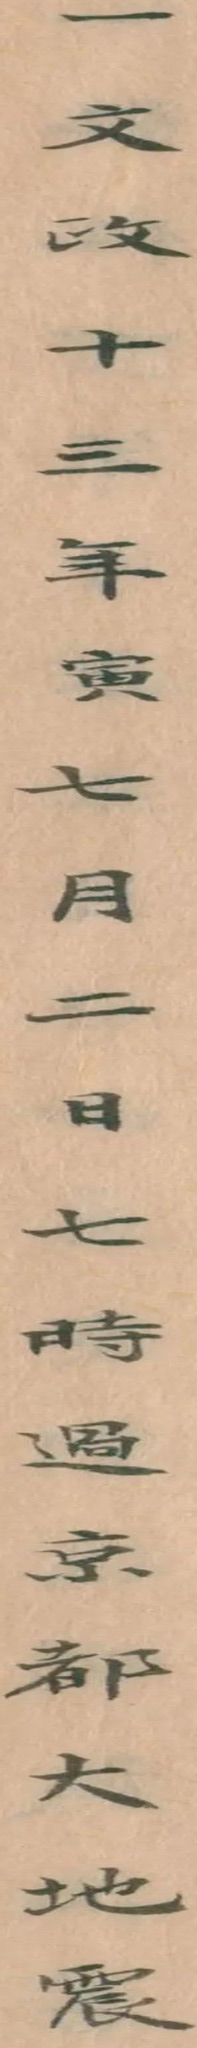一文政十三年寅七月二日七時過京都大地震

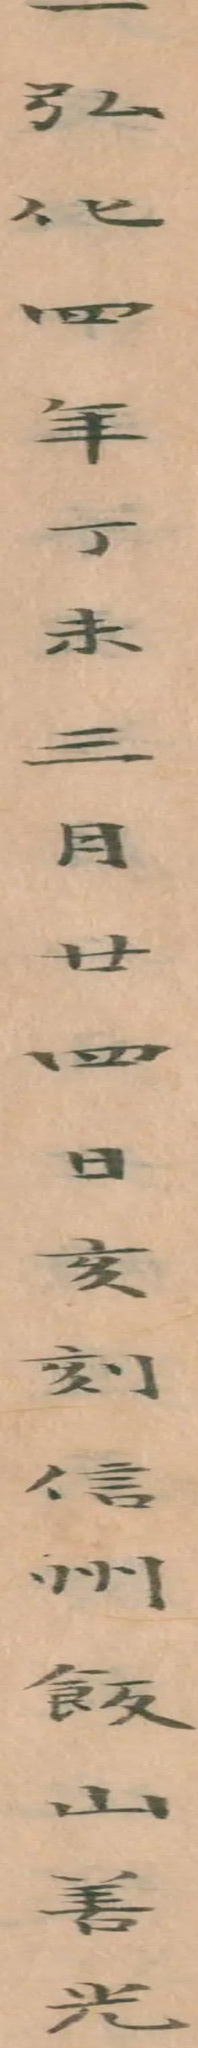一本化四年丁未三月廿四日亥刻信州飯山善光
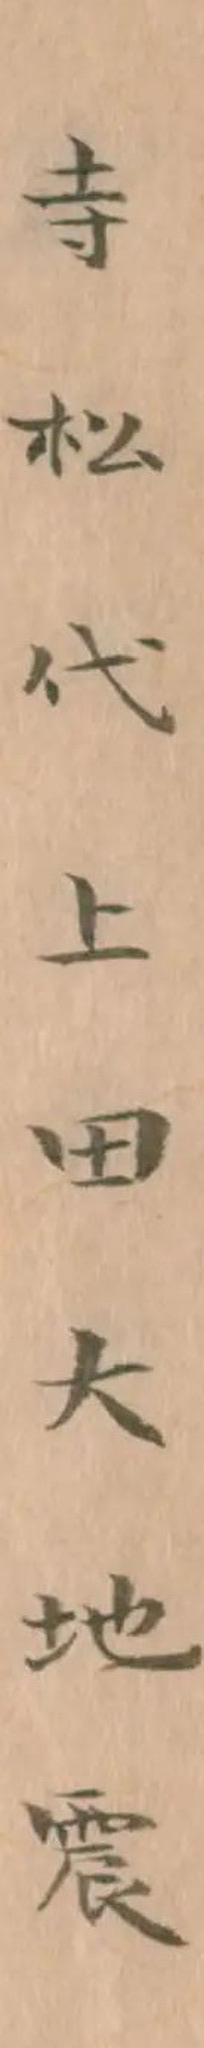寺松代上田大地震
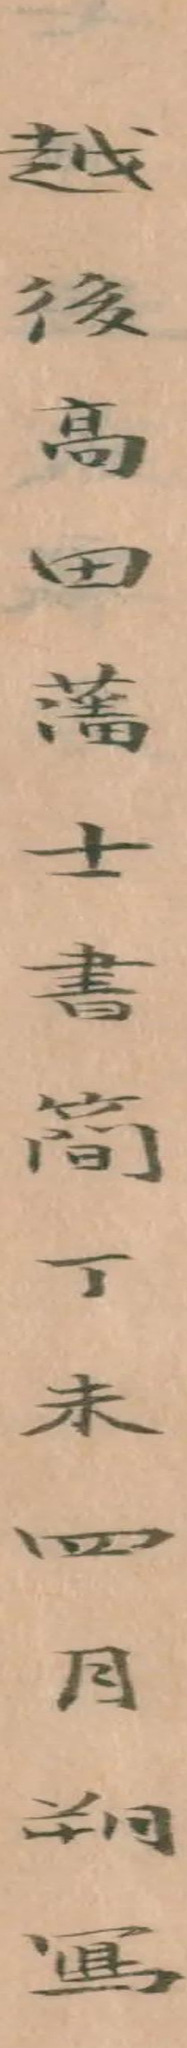越後高田藩士書簡丁未四月朔写
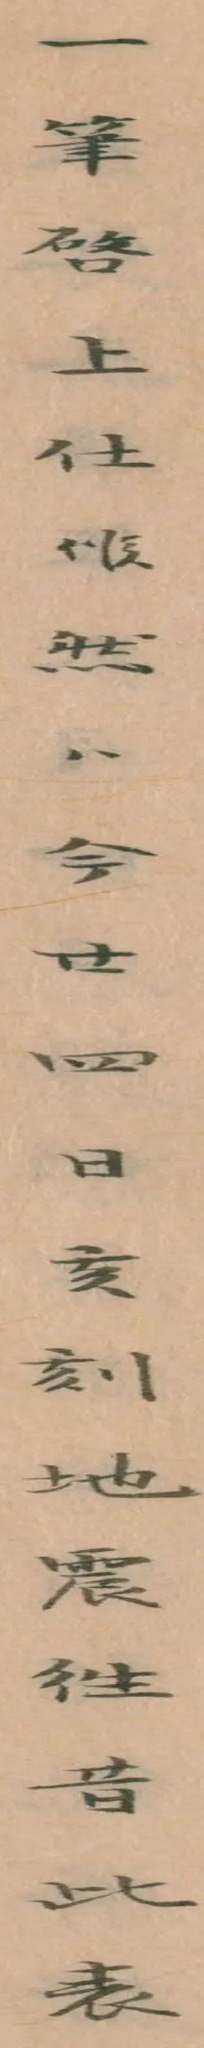一筆啓上仕候然ハ今廿四日亥刻地震往昔此表
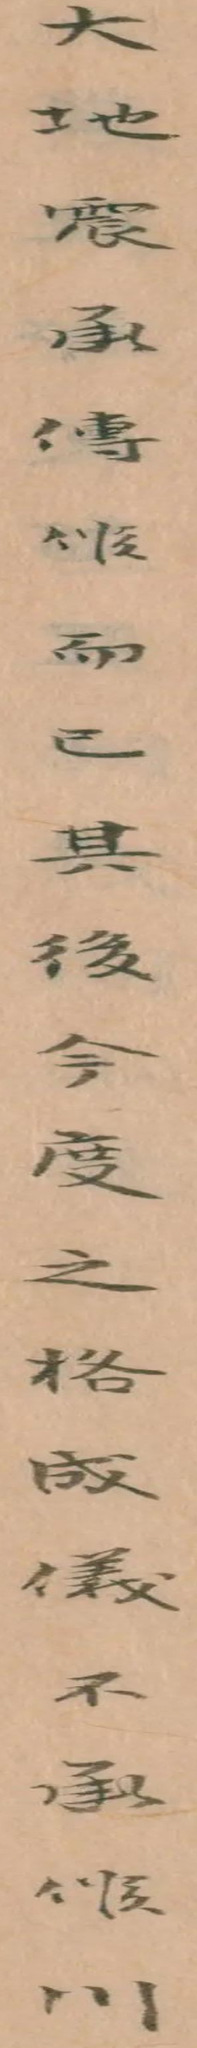大地震承伝候而己其後今度之格成儀不承候川
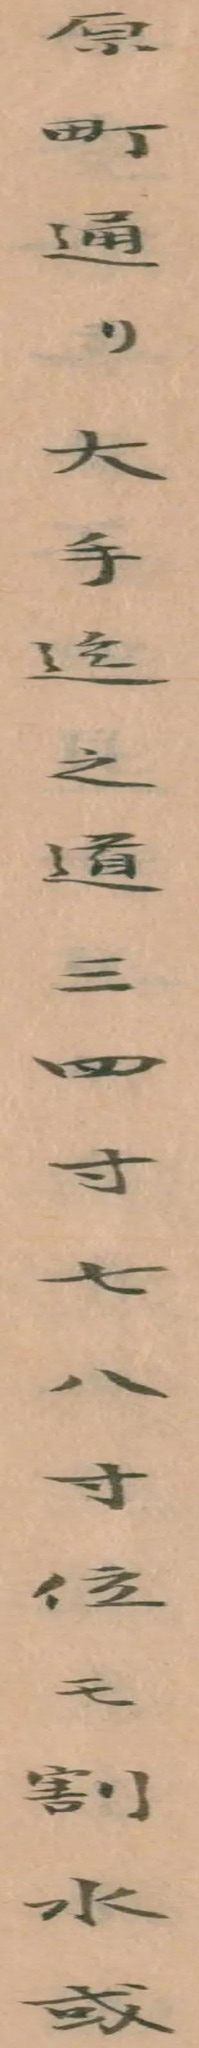原町通リ大手迄之道三四寸七八寸位モ割水或
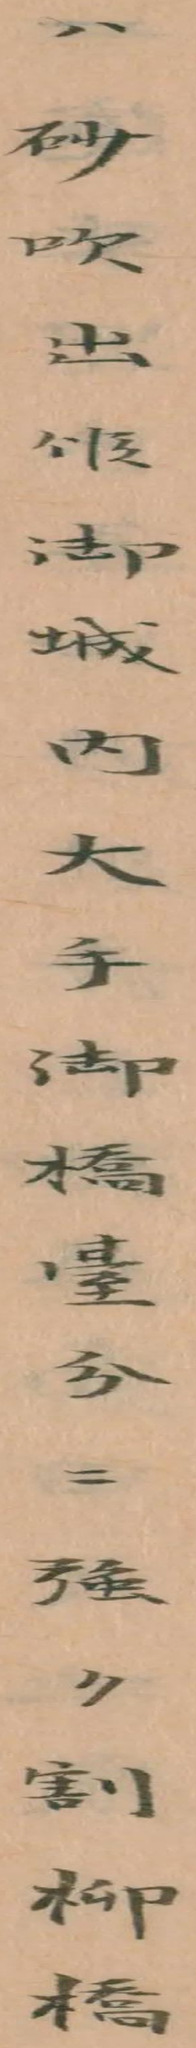ハ砂吹出候御城内大手御橋臺分二強ク割柳橋
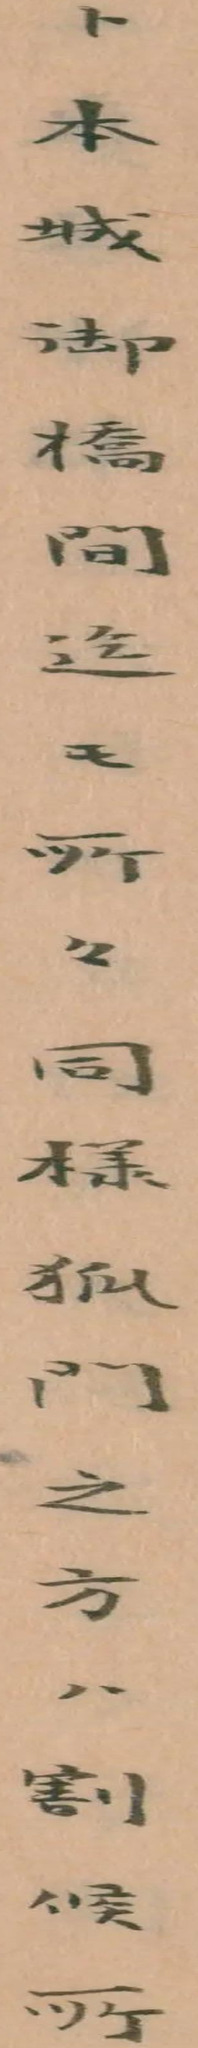ト本城御橋間迄モ所々同様狐門之方ハ割候所
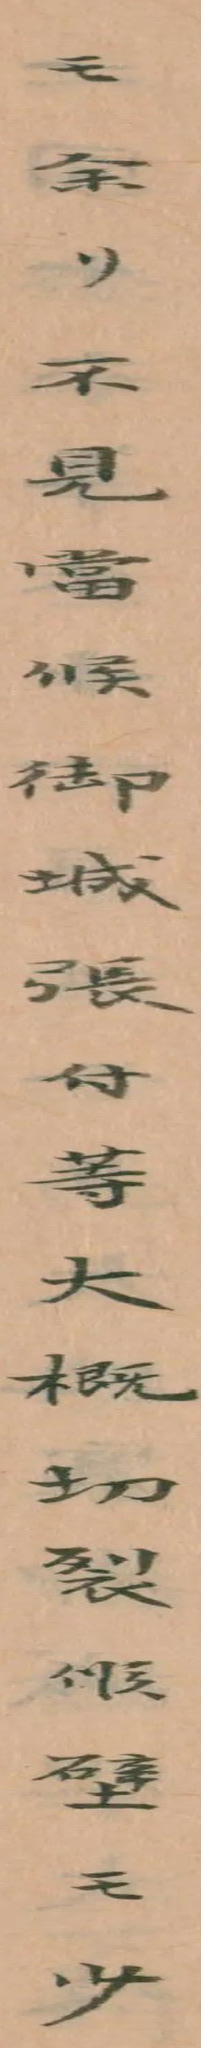モ余り不見当候御城張付等大概切裂候壁モ少
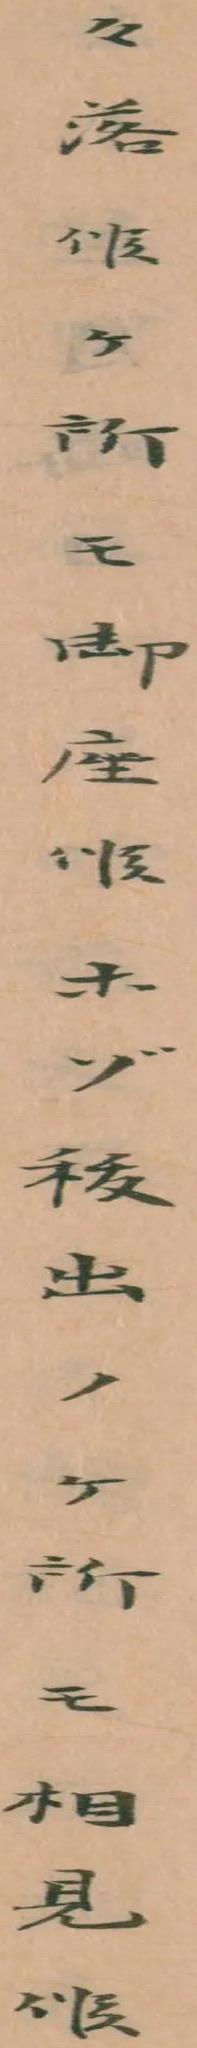々落候ヶ所モ御座候ホゾ抜出ノヶ所モ相見候
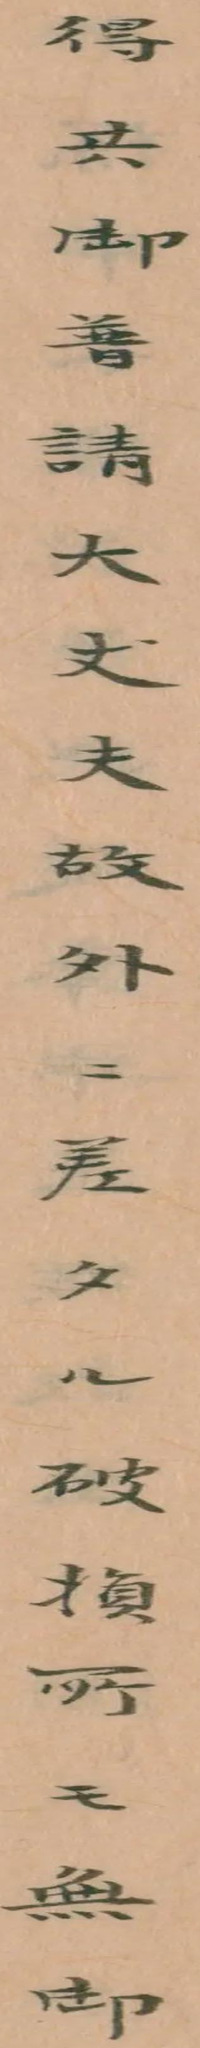得共御普請大丈夫故外二差タル破損所モ無御
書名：地災撮要. 巻1(噴火山・地震ノ部)
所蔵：国立国会図書館 National Diet Library, JAPAN
